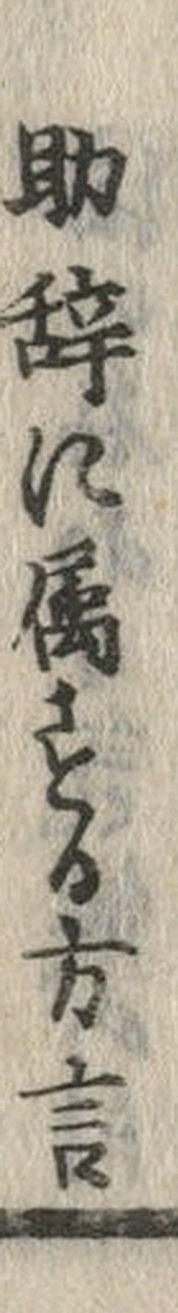助辞に属する方言
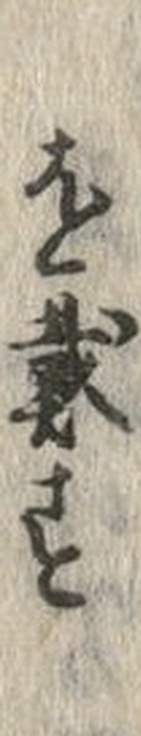を戴す
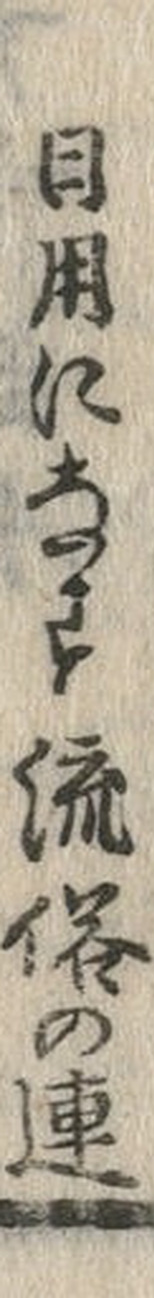日用になす流俗の連
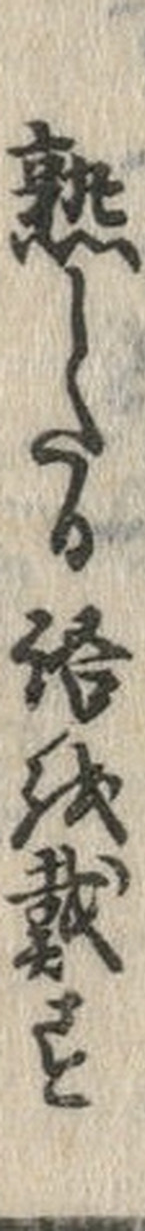熟したる語を戴す

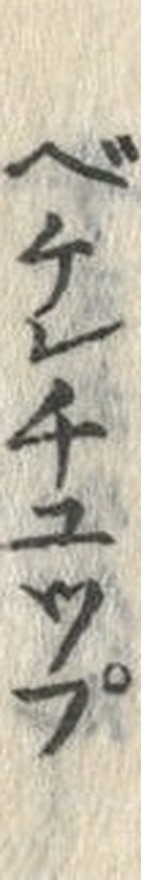日ベケレチユツプ
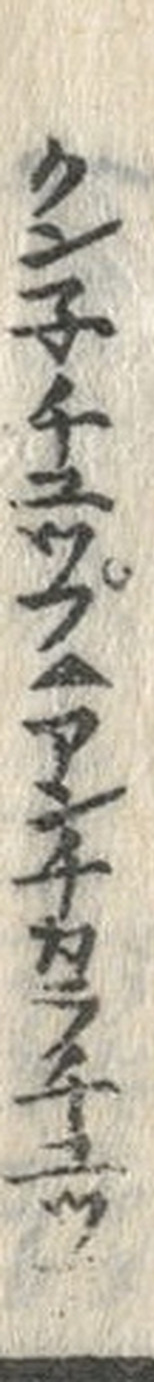月クンネチユツプ▲アンチカラチユツ

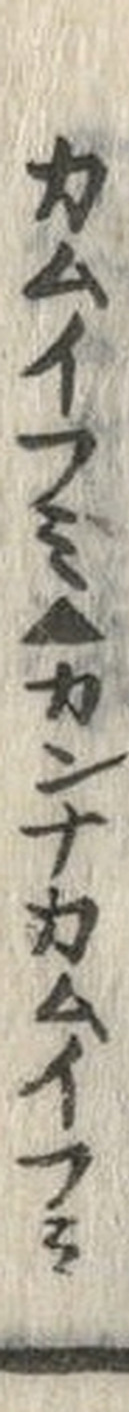雷カムイフミ▲カンナカムイフミ
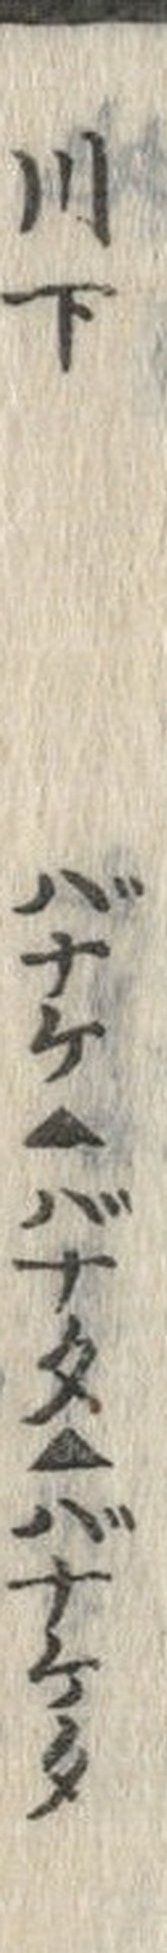川下バナケ▲バナタ▲バナケタ
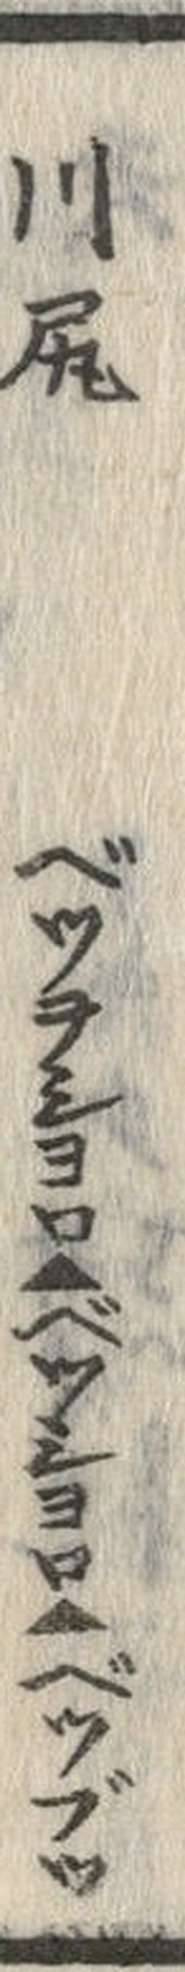川尻ベツヲシヨロ▲ベツシヨロ▲ベツブツ

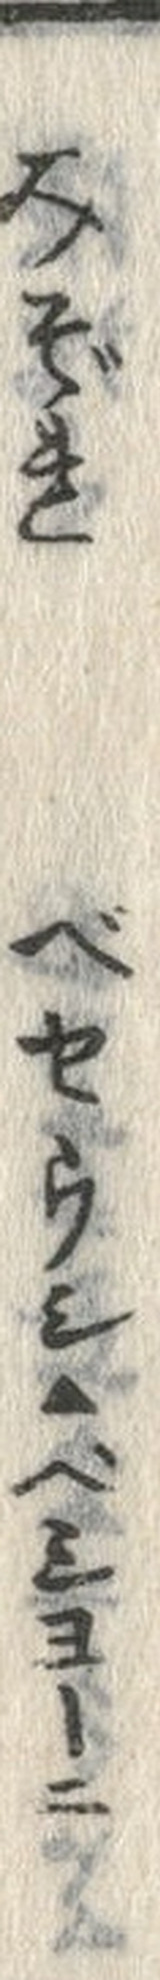みぞれベセウシ▲ベシヨーニ
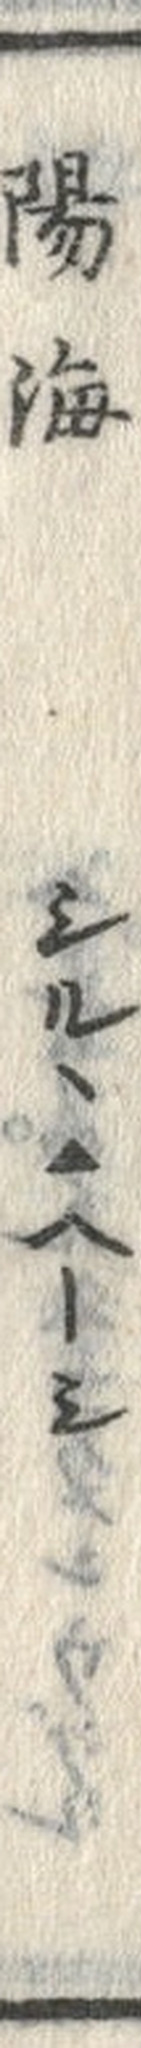陽海シルヽ▲ヘーシ

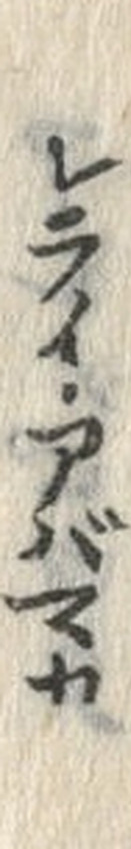暈レライアバマカ
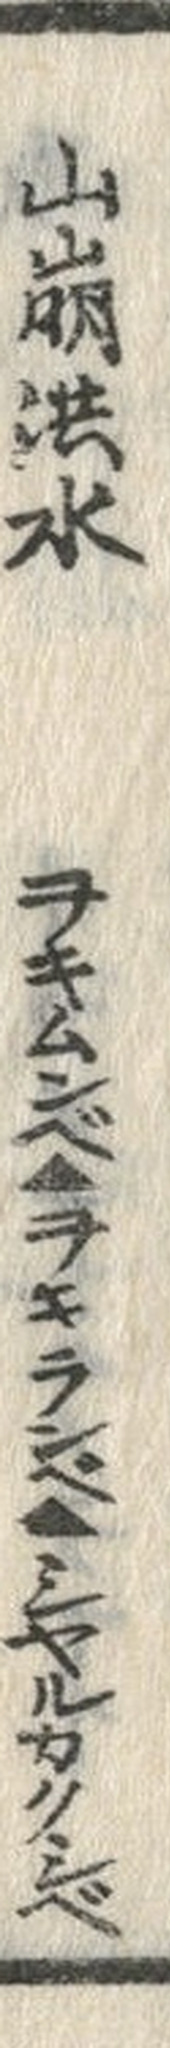山崩洪水ヲキムンベ▲ヲキランベ▲シヤルカクシベ
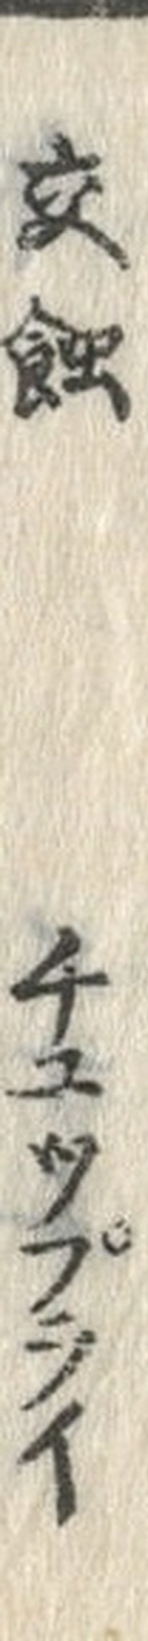交蝕チユツプライ
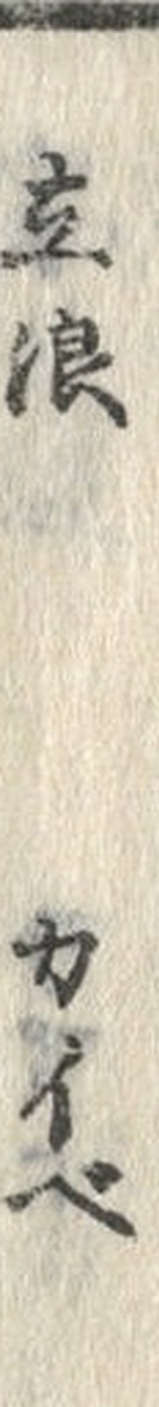立波カイベ
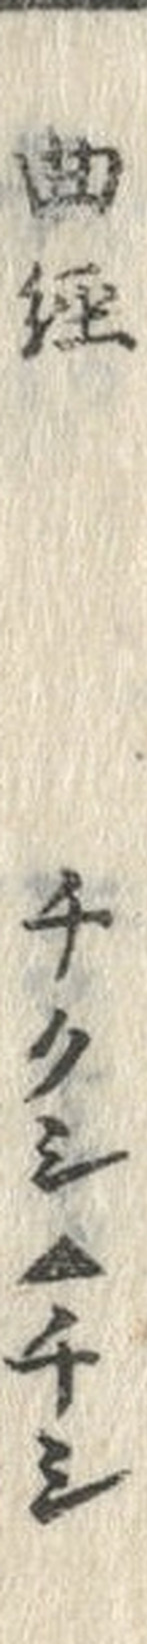曲径チクシ▲チシ
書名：蝦夷方言藻汐草　乾巻
